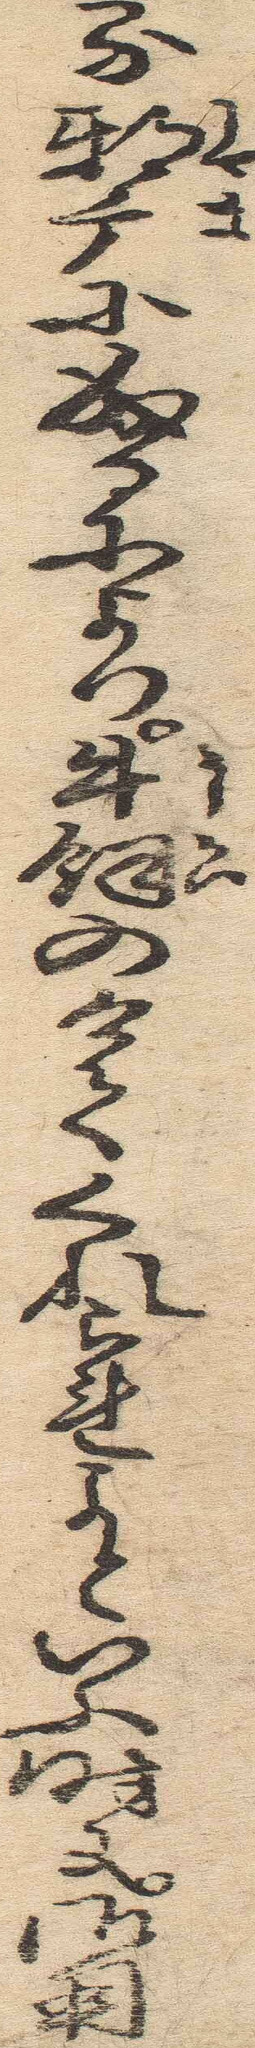る邪厂に成るにより。牛飼のけてくれられよといふ時に。御用
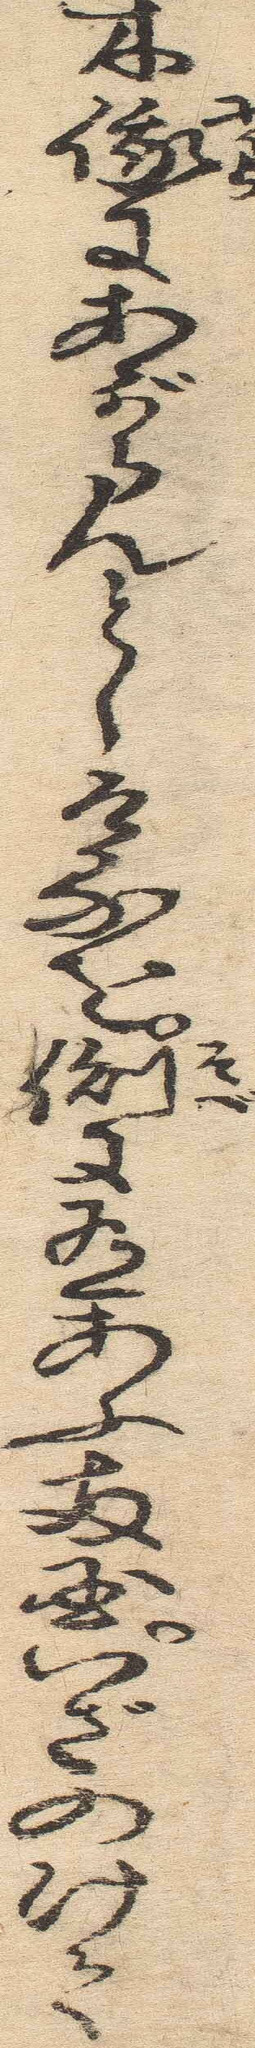木俄にあがらんとしけるを。側に有あふ両國。いざのけて
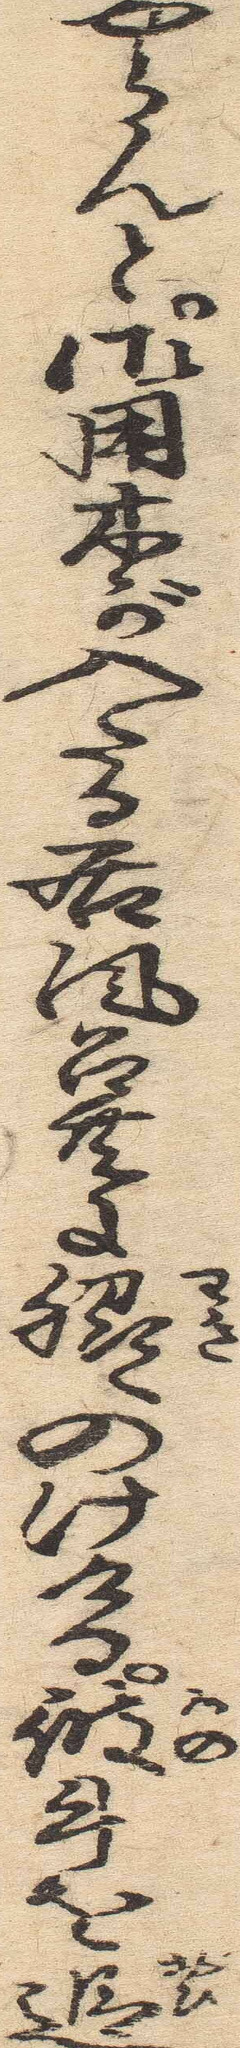やらんと。御用木が入たる居風呂共に脇へのけける。彼牛を追
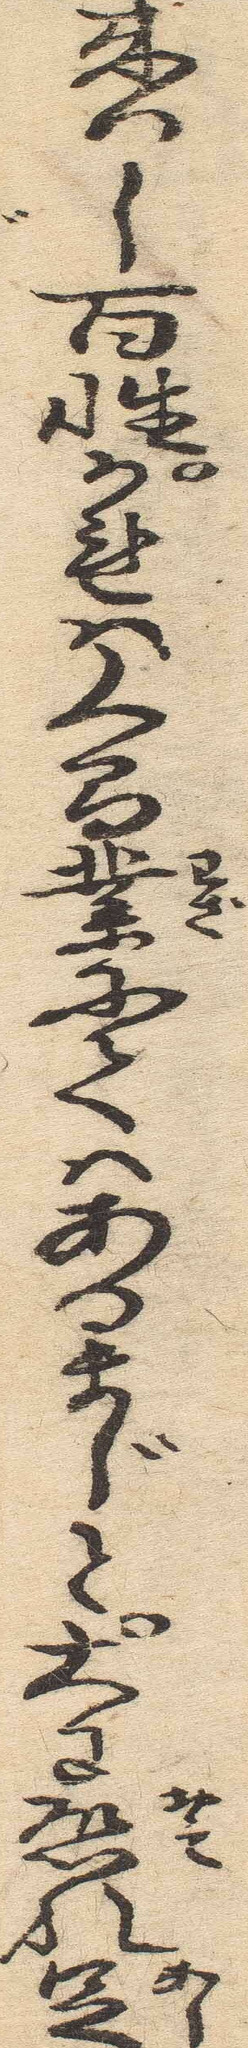来りし百姓。かれは人間業にてはあるまじと。大に恐れ足
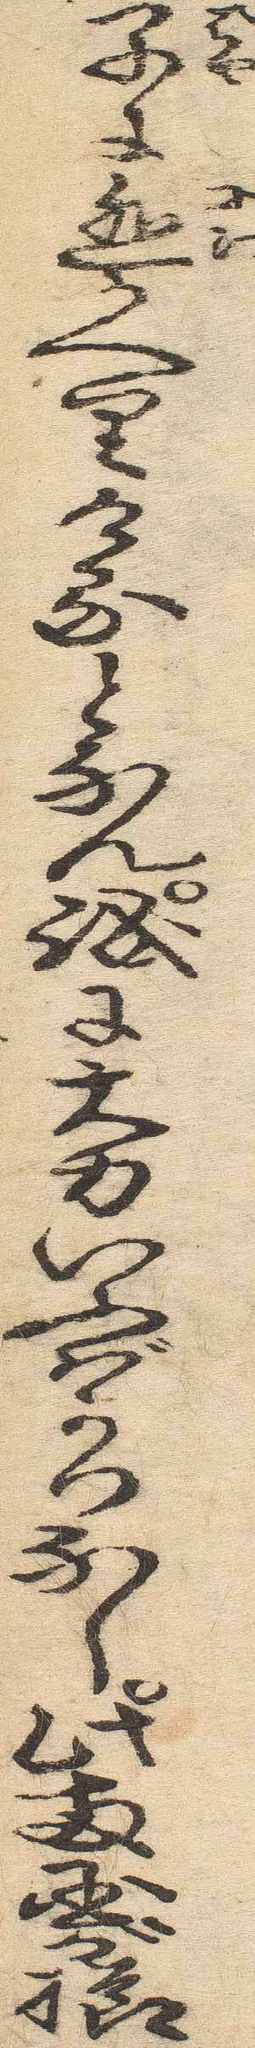早に逃かへりけるとなん。誠に大力いふばかりなし。此両國が櫛
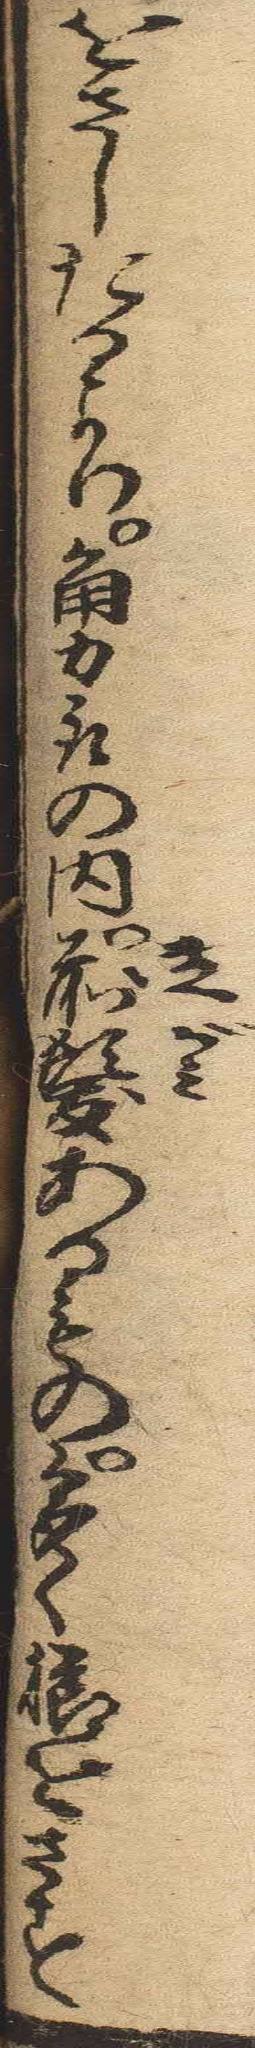をさしたるより。角力取の内。前髪あるもの。多く櫛をさす
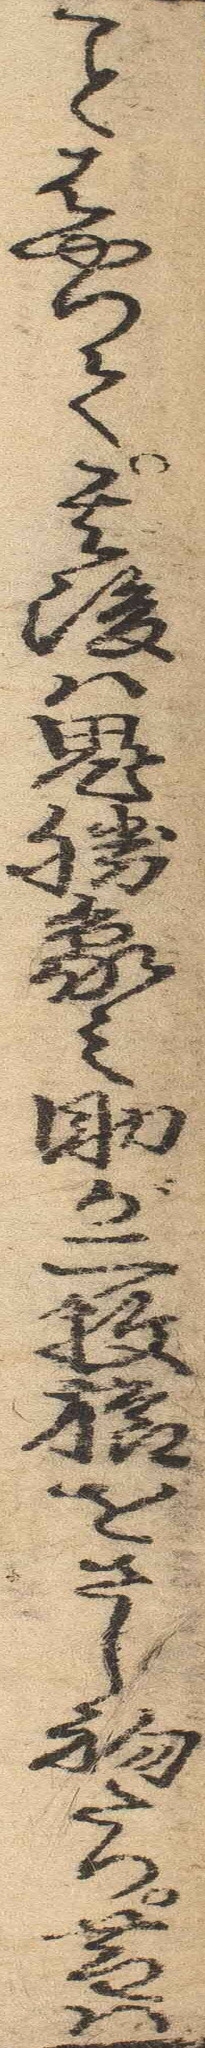ことはやりて。其後は鬼勝象之助が二枚櫛をさし初たり。昔は
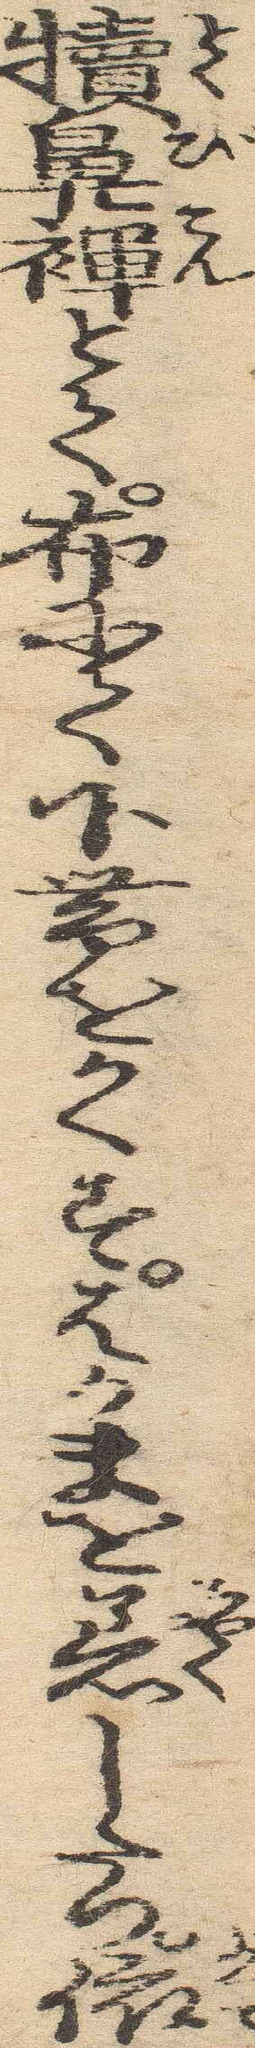犢鼻褌とて。布にて下帯をかくす。はかまを着したり。依
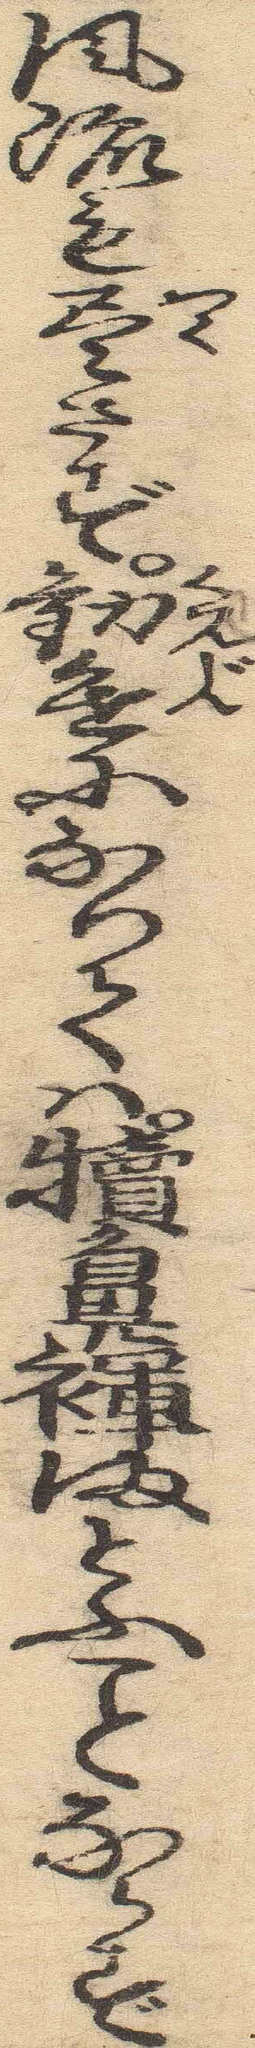風流も尽さず。勧進になつては犢鼻褌まとふことならず
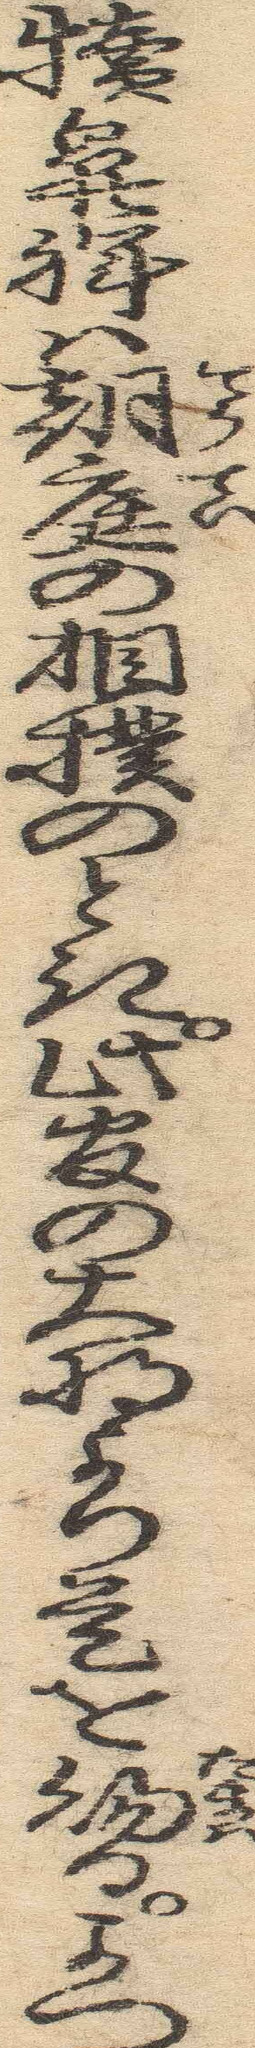犢鼻褌は朝庭の相撲のとき。此官の大将より是を賜る。よつ
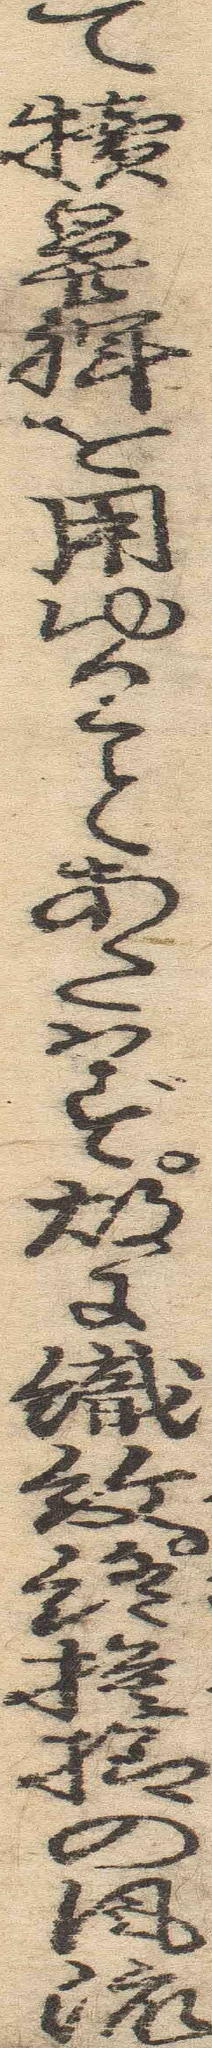て犢鼻褌を用ゆることあたはず。故に織紋。縫模様の風流
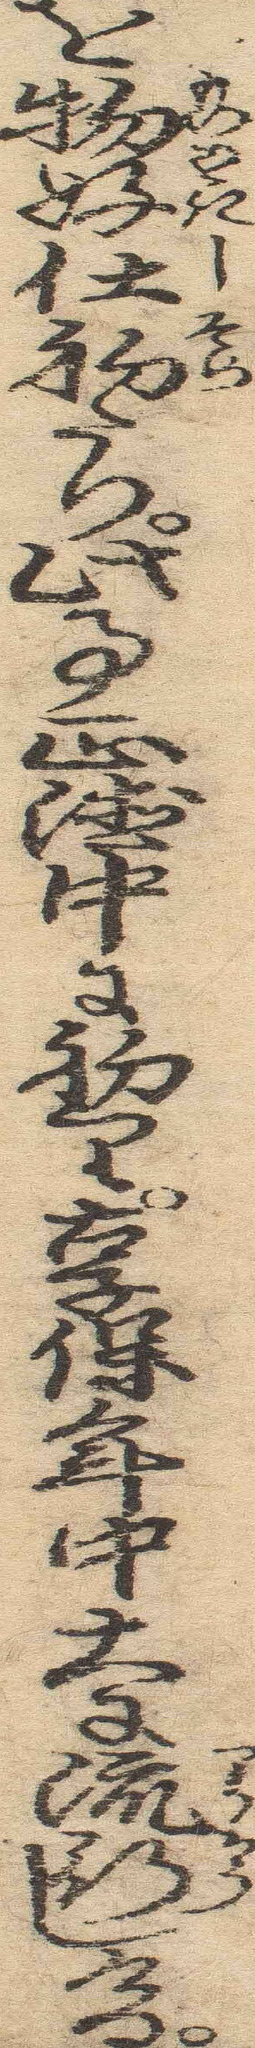を物好仕初たり。此事正徳中に初り。享保年中大に流行しける。
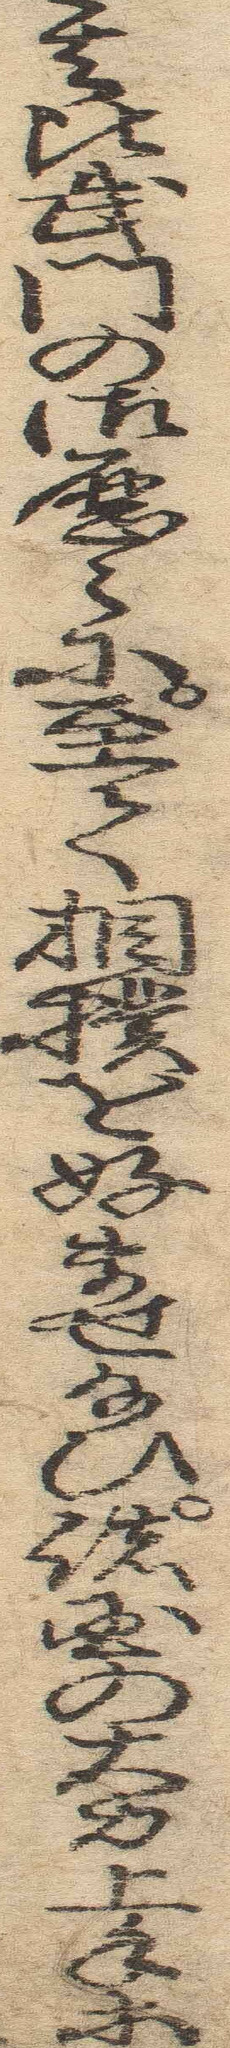其比武門の御歴々に。至て相撲を好ませ給ひ。諸国の大力上手等
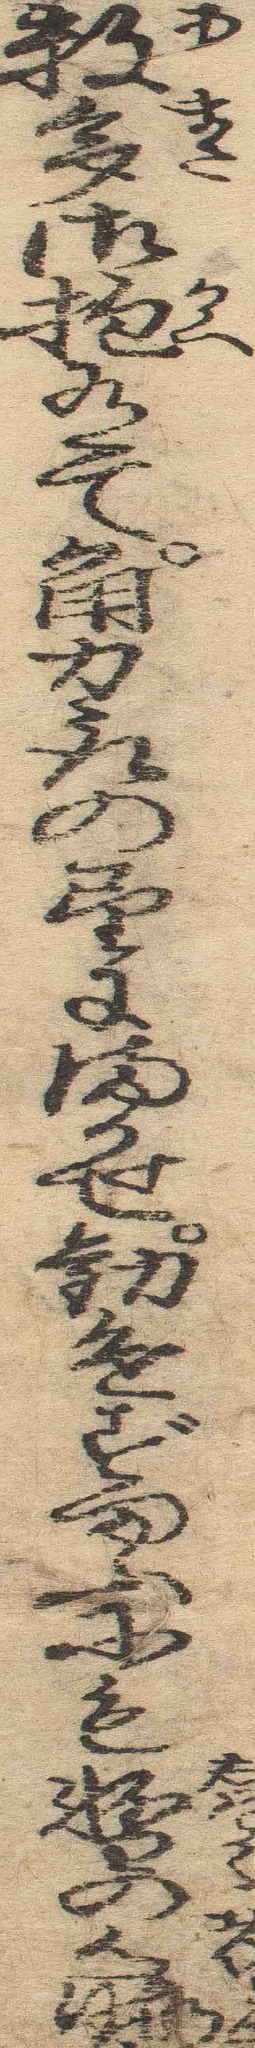数多御抱有て。角力取の望にまかせ。勧進ずまふにも暫の御暇
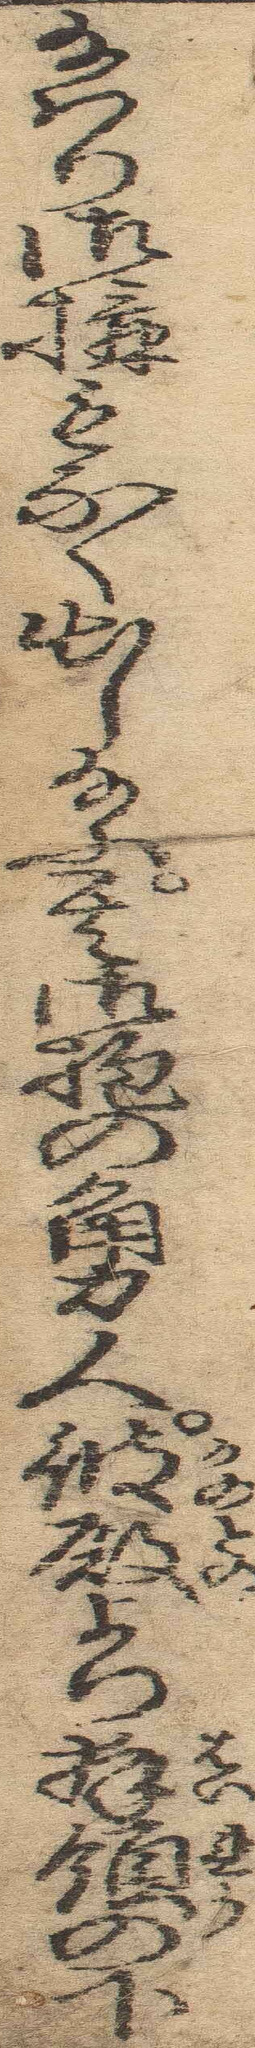給はり御構もなく出し給ふ。其御抱の角力人。彼殿より拝領の下

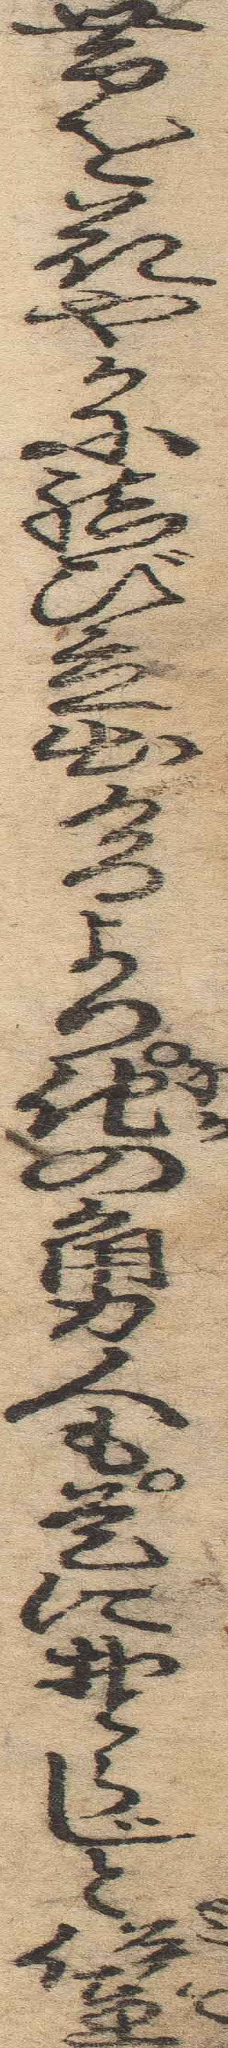帯を花やかに結び立出けるより。他の角力人も。是におとらじと伊達
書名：古今相撲大全
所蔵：東京学芸大学附属図書館 国文学研究資料館
